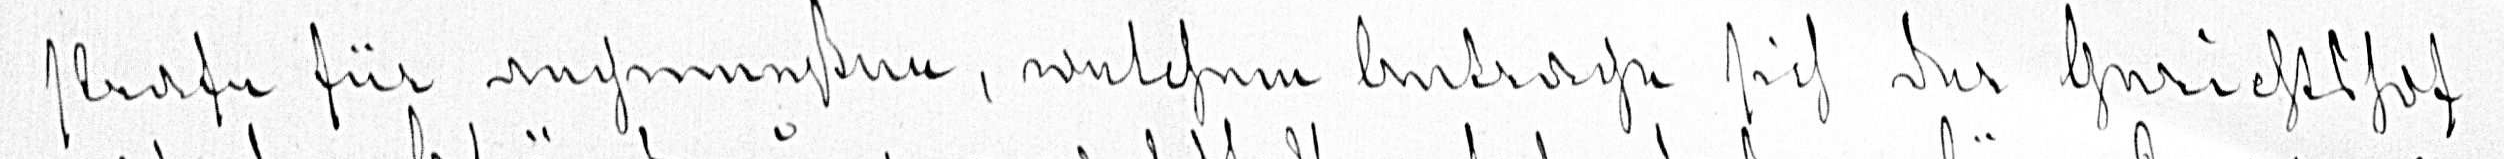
strafe für angemeßen, welchem Antrage sich der Gerichtshof
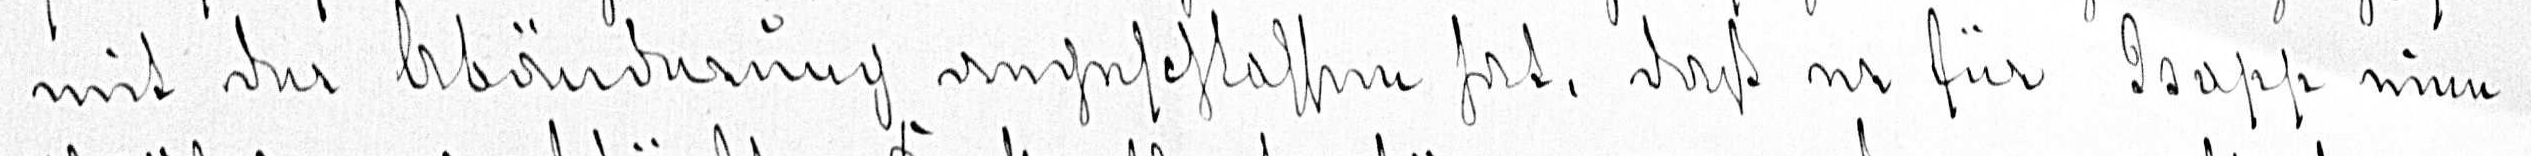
mit der Abänderung angeschlossen hat, daß er für Isopp eine
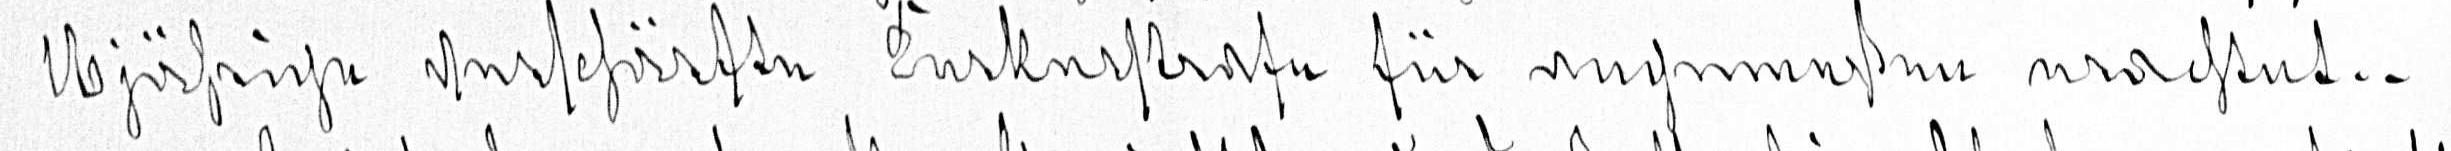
16jährige verschärfte Kerkerstrafe für angemeßen erachtet.
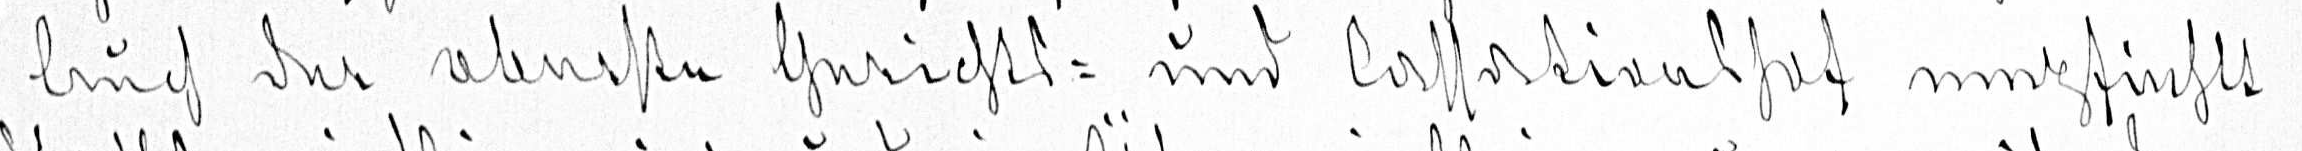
Auch der oberste Gerichts- und Cassationshof empfiehlt
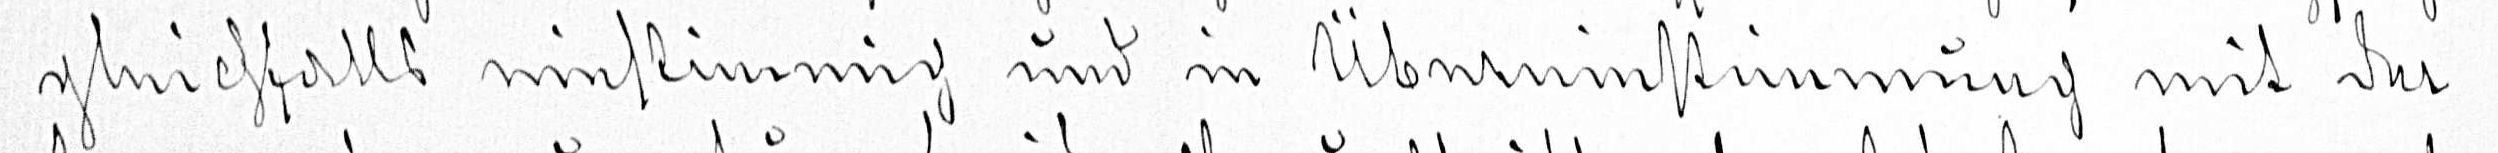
gleichfalls einstimmig und in Übereinstimmung mit der
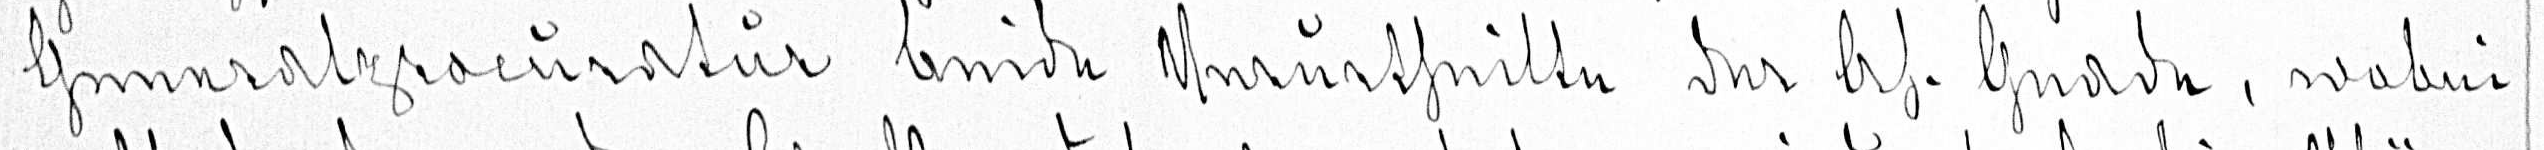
Generalprocuratur beide Verurtheilte der Ah. Gnade, wobei
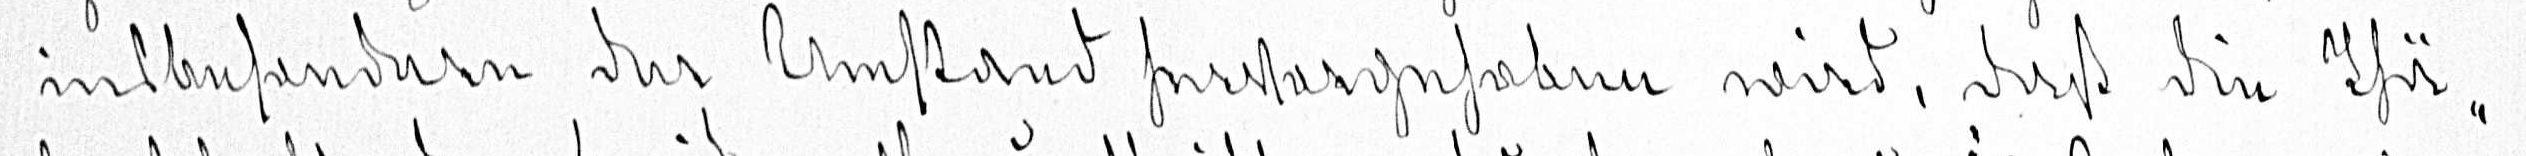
insbesondere der Umstand hervorgehoben wird, daß die Thä¬
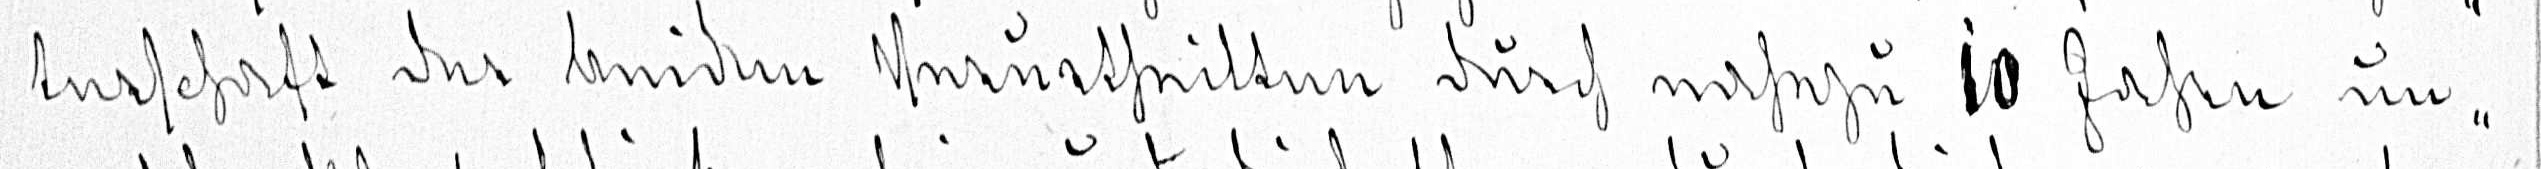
terschaft der beiden Verurtheilten durch nahezu 10 Jahren un¬
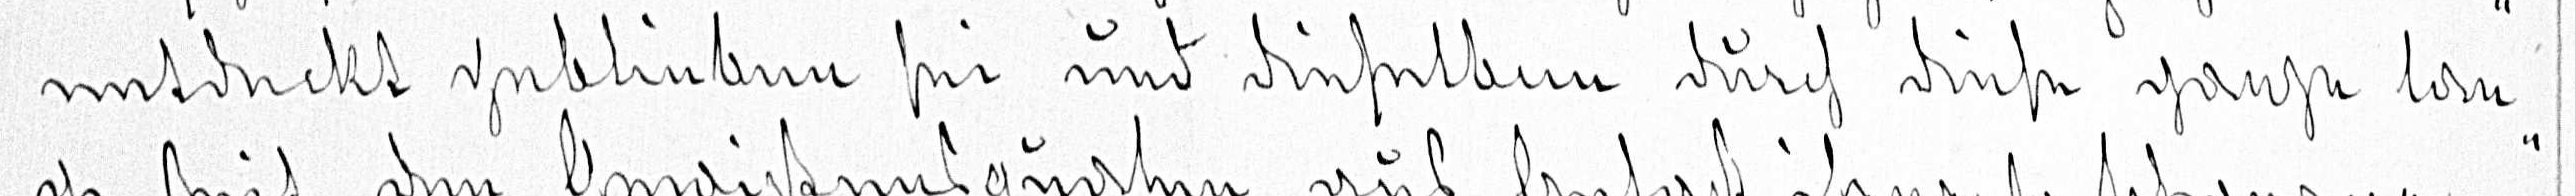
entdeckt geblieben sei und dieselben durch diese ganze lan¬
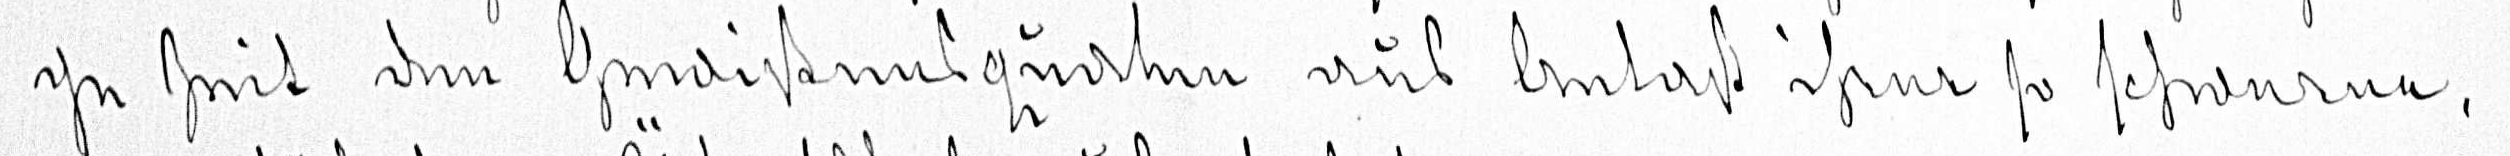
ge Zeit den Gewißensqualen aus Anlaß ihrer so schweren,
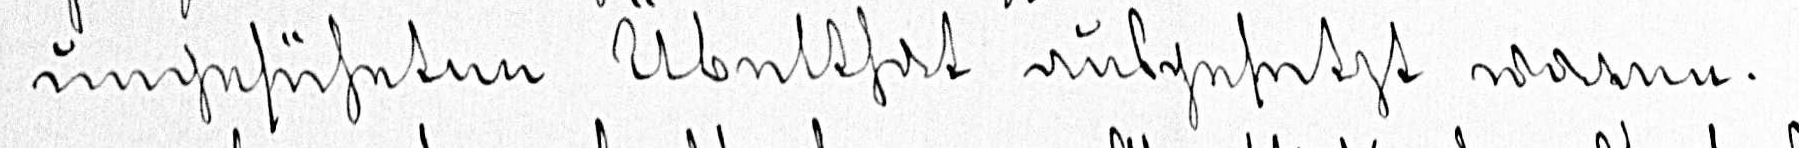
ungeführten Übelthat ausgesetzt waren.
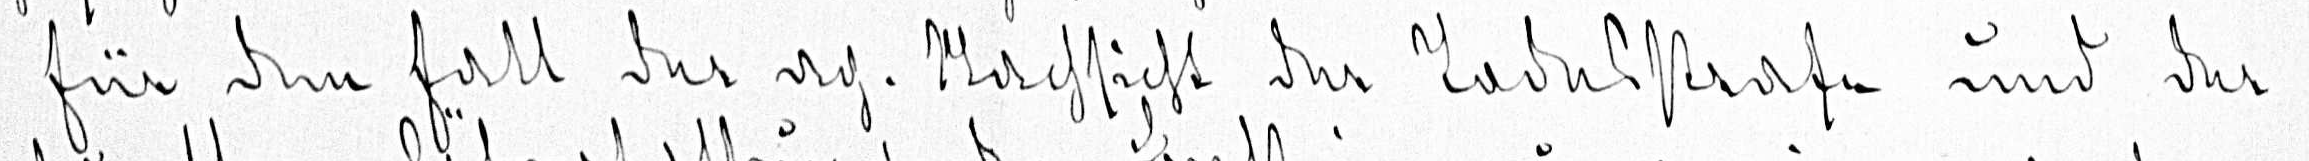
Für den Fall der ag. Nachsicht der Todesstrafe und der
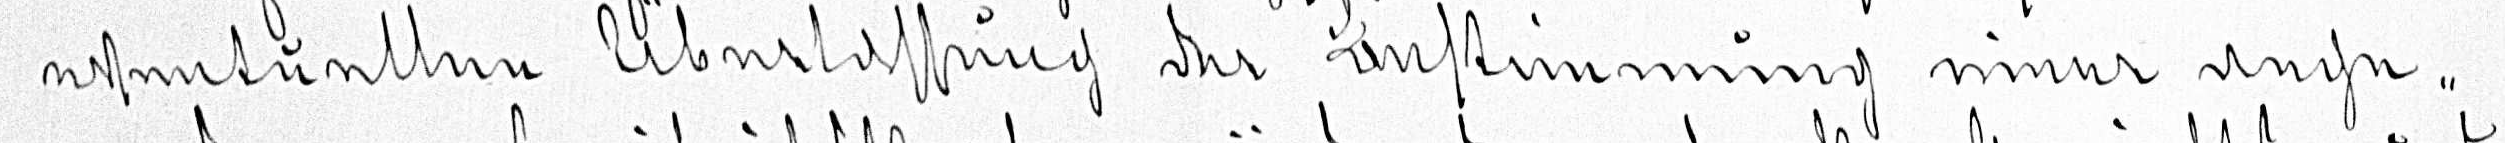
eventuellen
